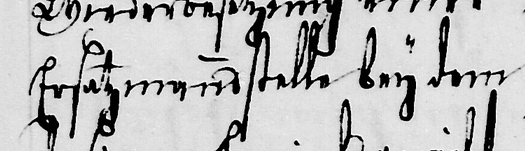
festgesetzt habe,
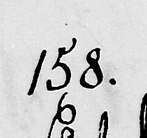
30.
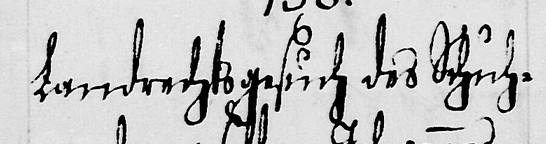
und denjenigen der Vier¬
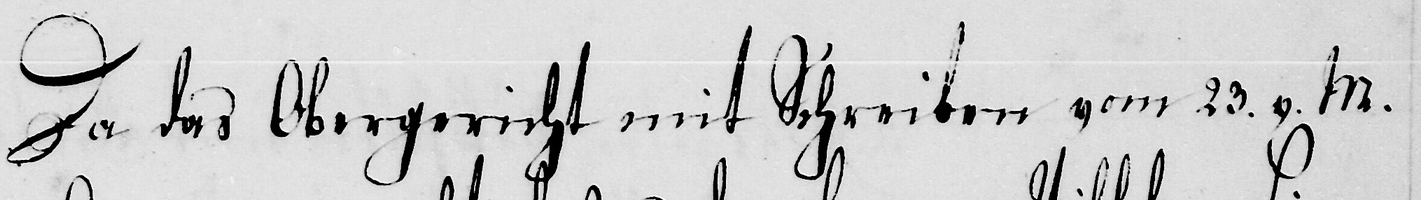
Da das Obergericht mit Schreiben vom 23. v. M.
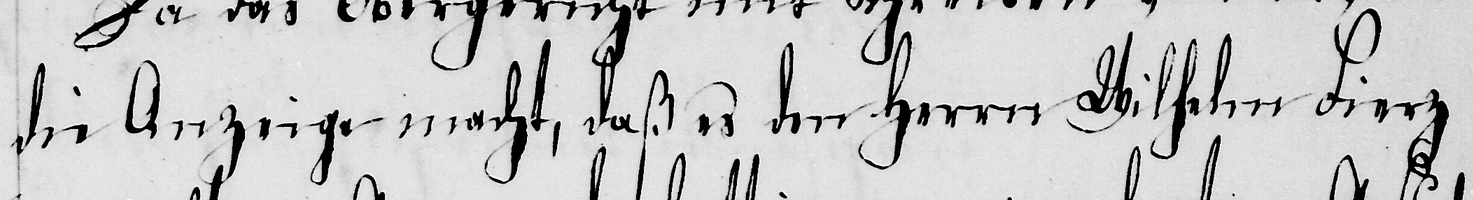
die Anzeige macht, daß es den Herrn Wilhelm Fierz
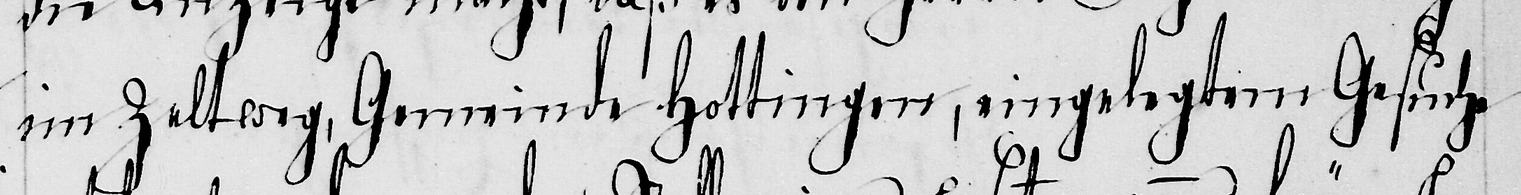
im Zeltweg, Gemeinde Hottingen, eingelegten Gesuche
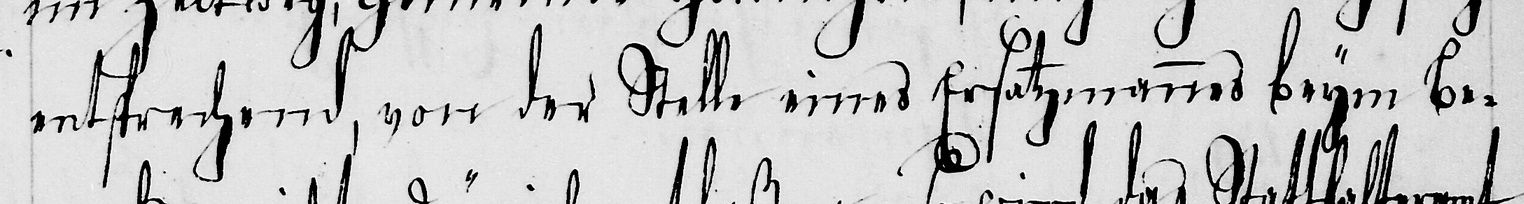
entsprechend, von der Stelle eines Ersatzmannes beym Be¬
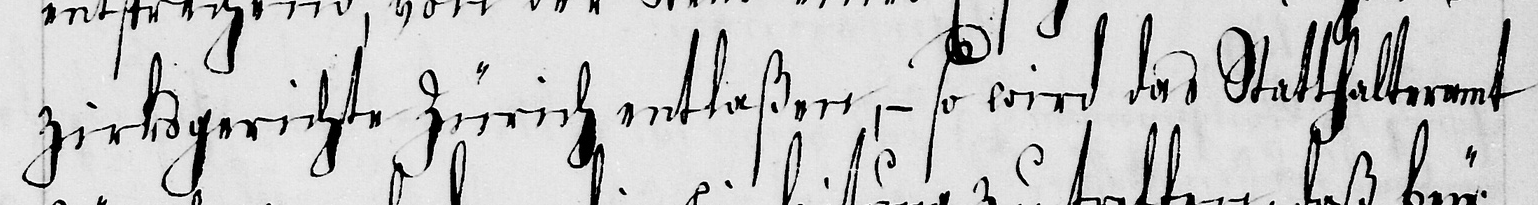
zirksgerichte Zürich entlaßen, – so wird das Statthalteramt
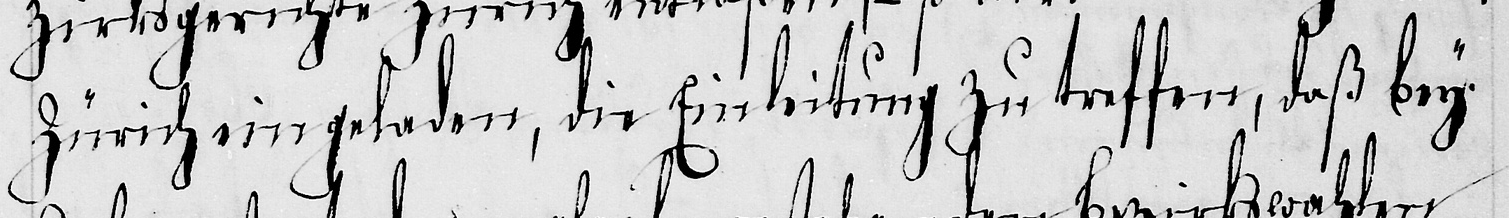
Zürich eingeladen, die Einleitung zu treffen, daß bey
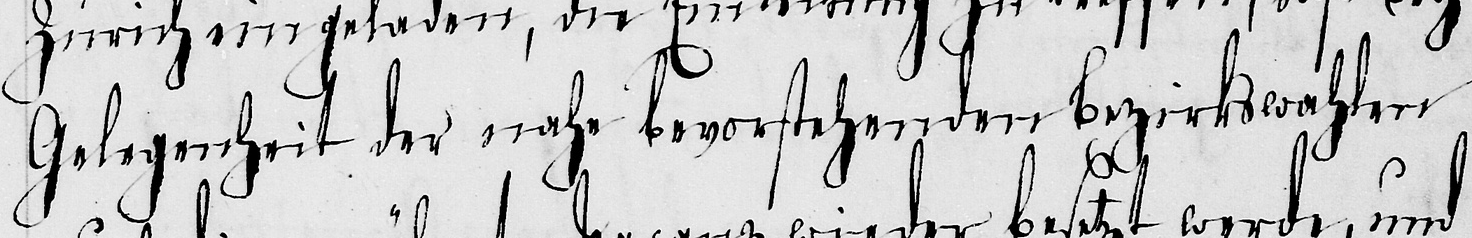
Gelegenheit der nahe bevorstehenden Bezirkswahlen
